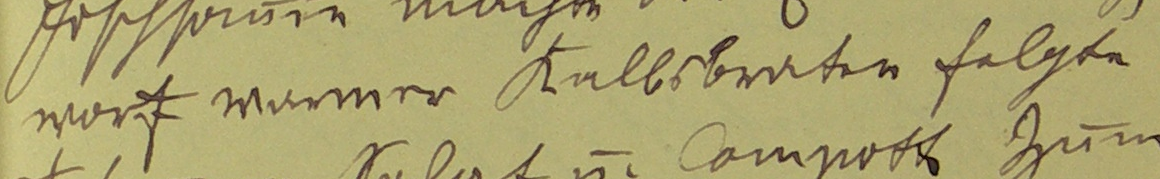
warmer Kalbsbraten folgte
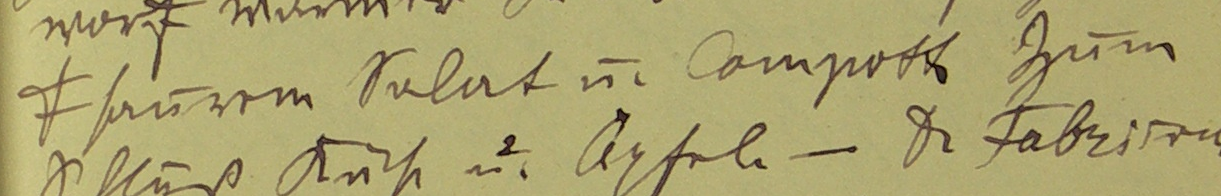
mit saurem Salat ind Compott. Zum
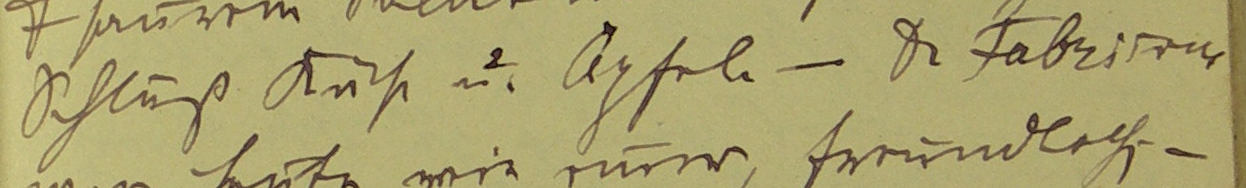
Schluß Käse und Äpfel—Dr. Fabricius
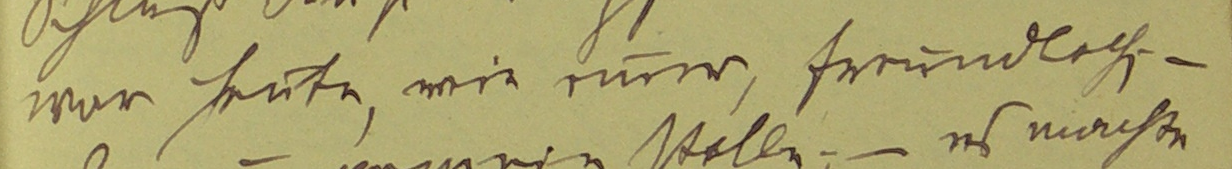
war heute wie immer freundlich
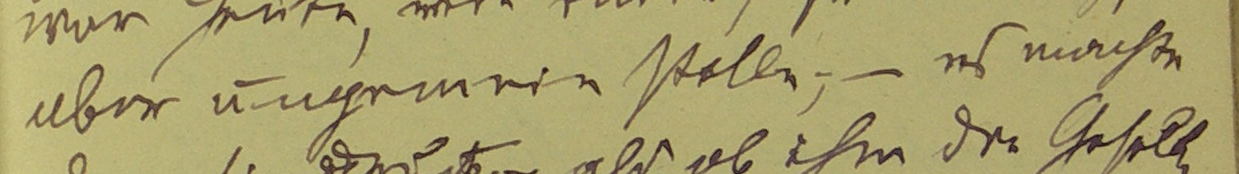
aber ungemein still,- es machte
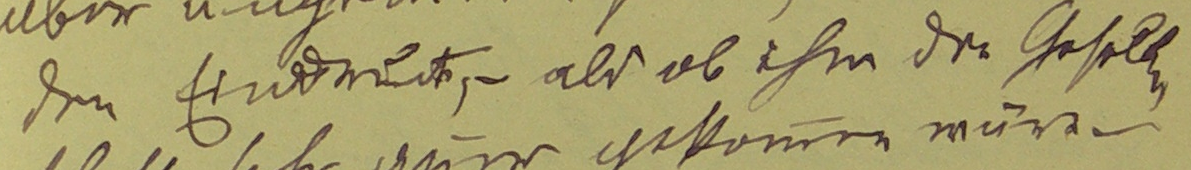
den Eindruck,- als ob ihm die Gesell¬
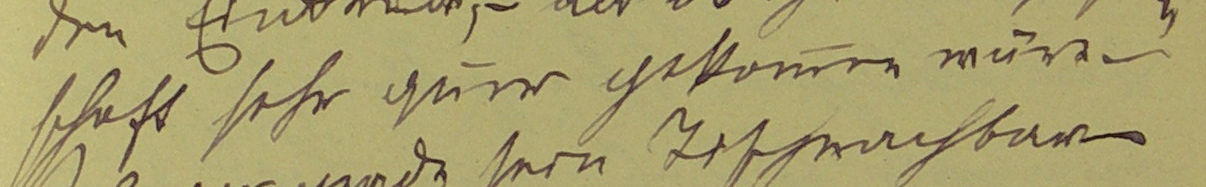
schaft sehr quer gekommen wäre.-
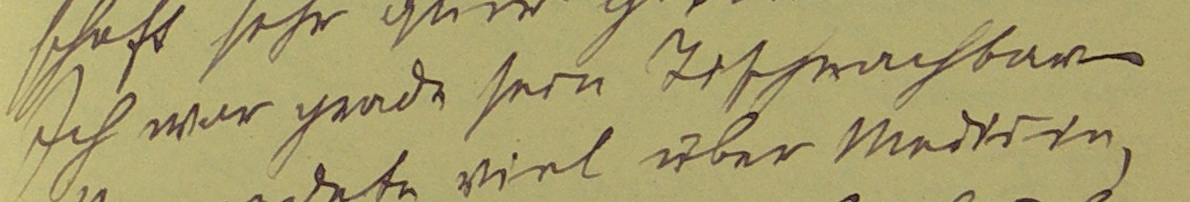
Ich war gerade sein Tischnachbar-
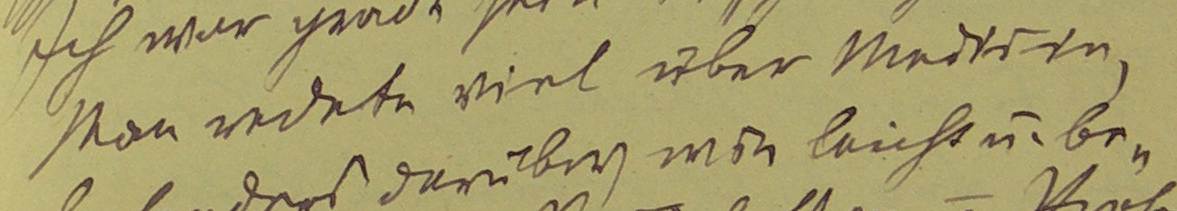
Man redete viel über Medizin
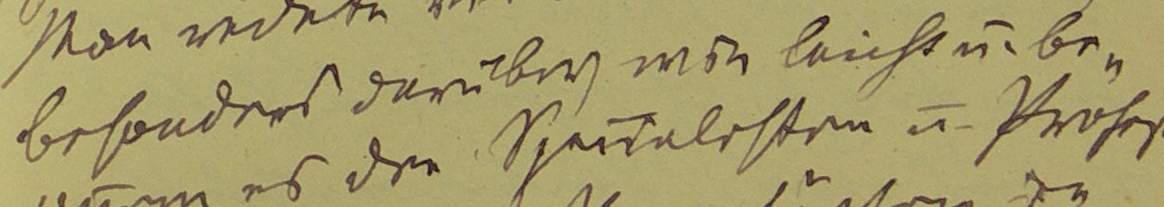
besonders darüber wie leicht und be¬
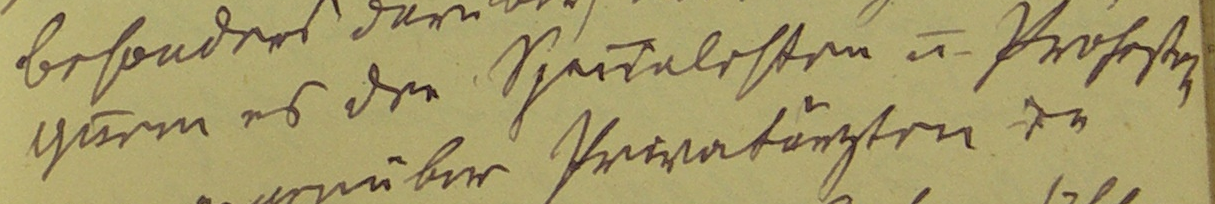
quem es den Spezialisten und Professo¬
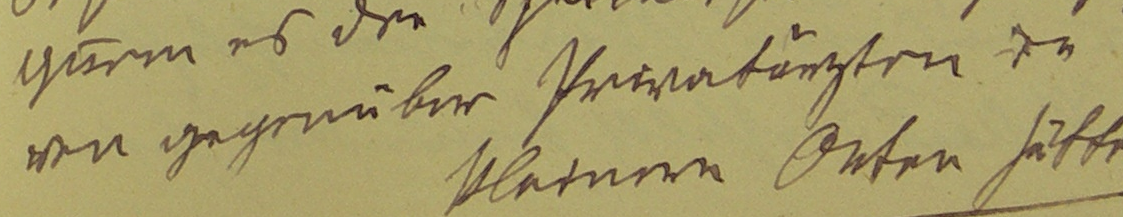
ren von gegenüber Privatärzten in
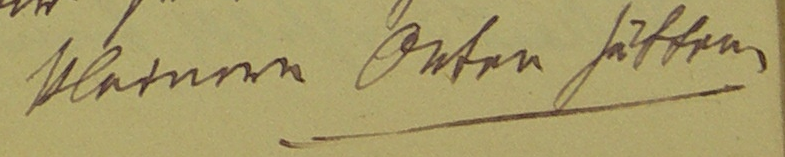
kleinen Orten hätten
